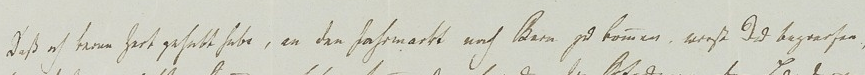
Daß ich keine Zeit gehabt habe, an den Jahrmarkt nach Bern zu kommen, wirst Du begreifen,
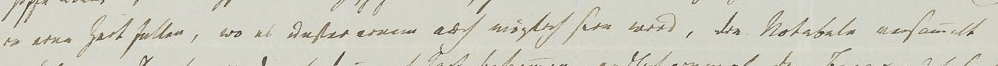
in eine Zeit fallen, wo es unser einem auch möglich sein wird, die Notabeln versammelt
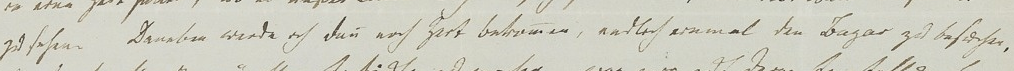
zu sehen. Daneben werde ich dann noch Zeit bekommen, endlich einmal den Bazar zu besuchen,
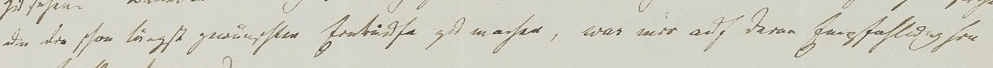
um die schon längst gewünschten Einkäufe zu machen, was mir auf Deine Empfehlung hin
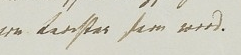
ein Leichtes sein wird.
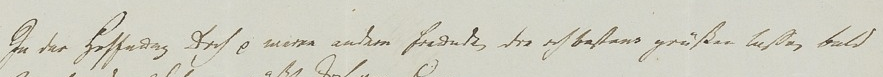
In der Hoffnung Dich & meine andern Freunde, die ich bestens grüßen lasse, bald
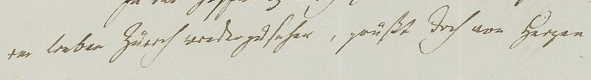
im lieben Zürich wiederzusehen, grüßt Dich von Herzen
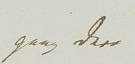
ganz Dein
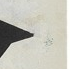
17.
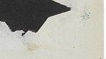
Dzbr.
